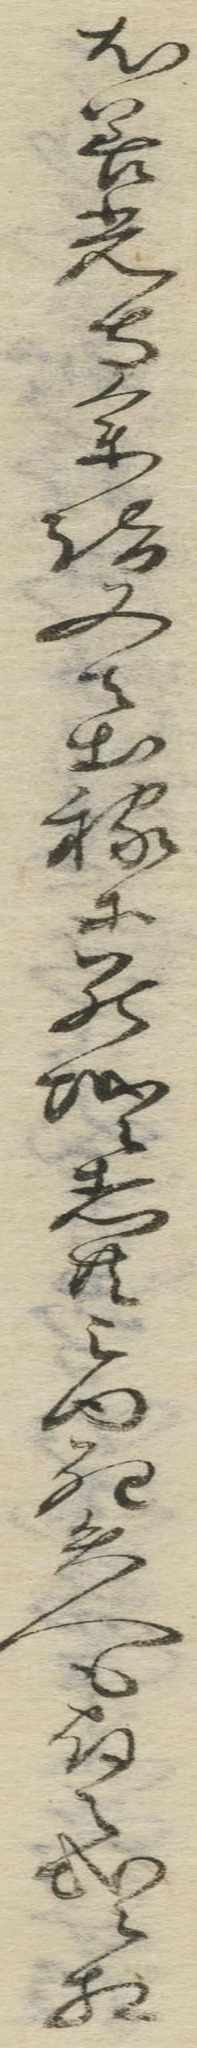尤善光寺参詣又は出稼等罷越候者共之内死失人も有哉二相
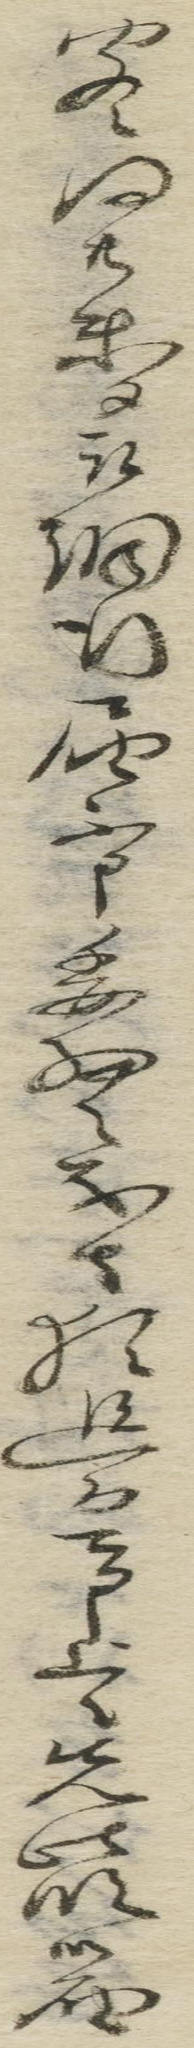聞候得共未タ取調行届不申委細之義は猶追而可申上候先此段御届
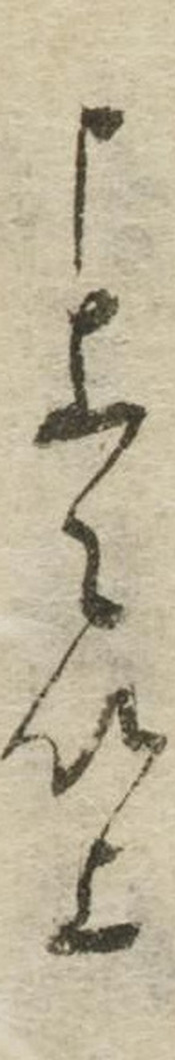申上候以上
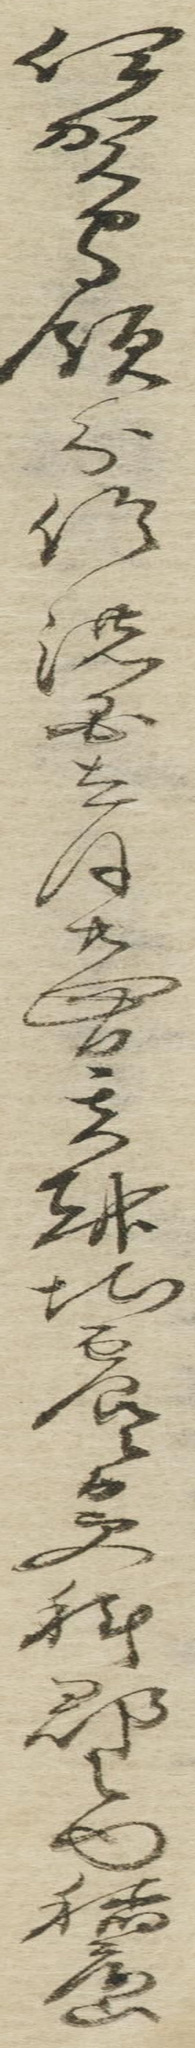伊賀守領分信濃国去付廿四日亥刻地震二付更級郡之内稲荷山
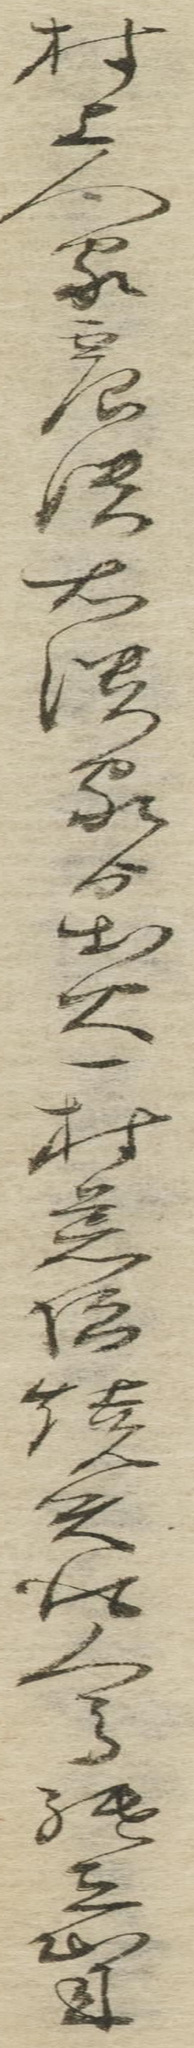村上人家居潰右潰家ゟ出火一村荒増焼失仕人馬継立出来
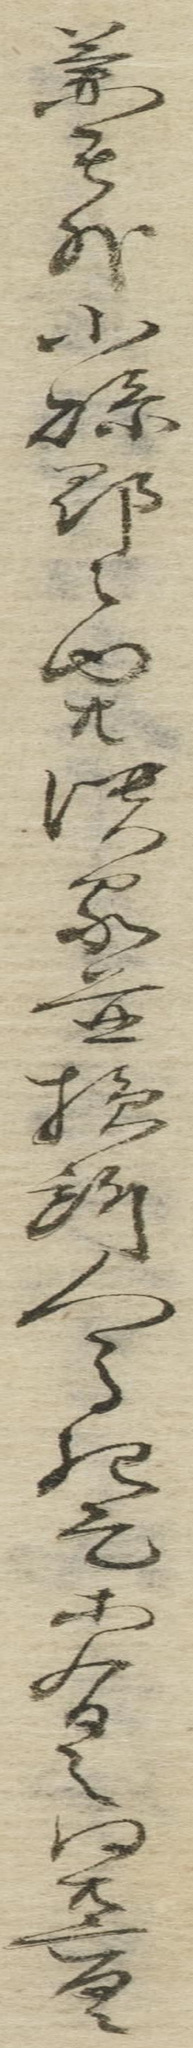兼其外小県郡之内共潰家並損所人馬死亡等有之同廿六日二

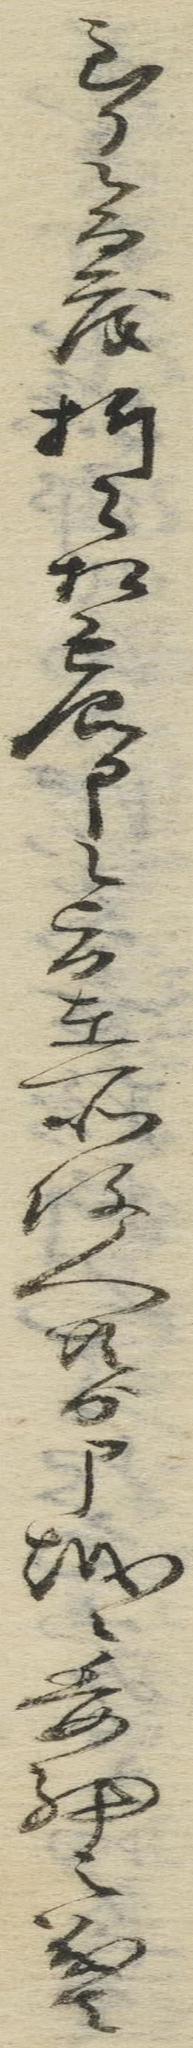至りたるも折々相震震候旨在所役人共ゟ申越候委細之義は
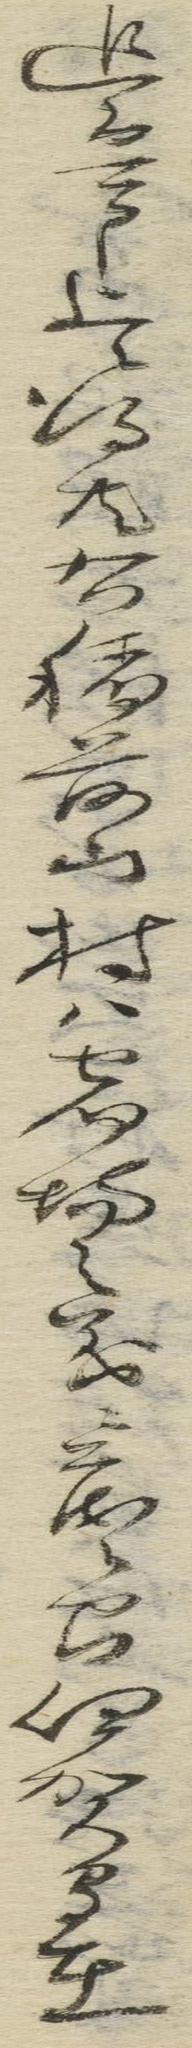追而可申上候得共右稲荷山村ハ宿場之義にも候間伊賀守在
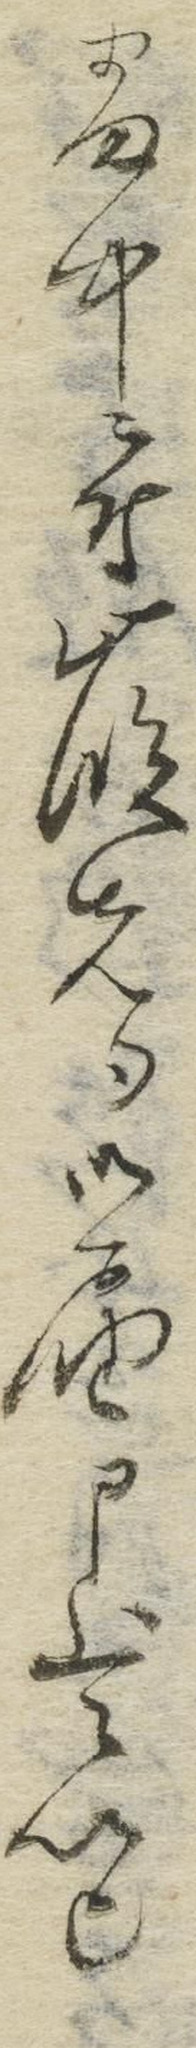番中二付此段先ッ御届申上候以上
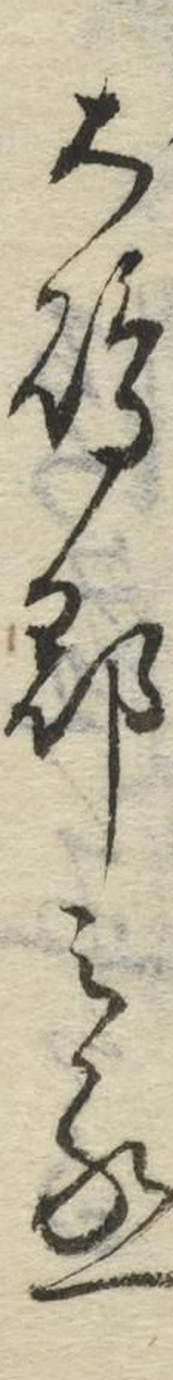大嶋郡之丞
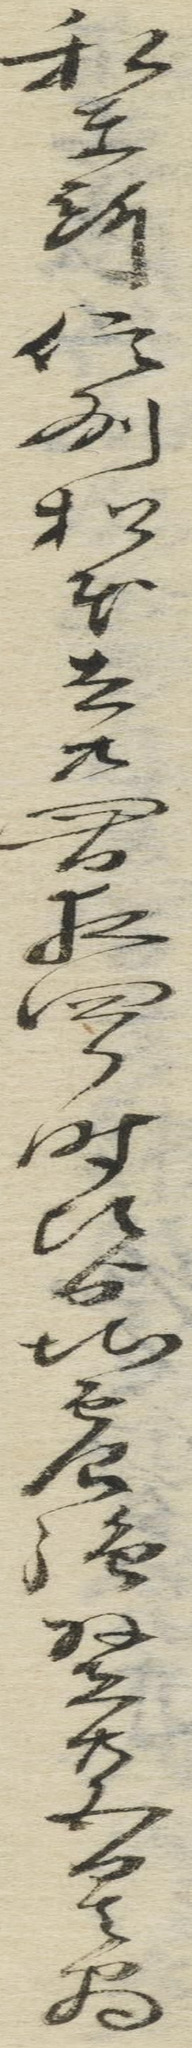私在所信州松本去廿四日夜四ッ時比ゟ地震強翌廿五日ハ為
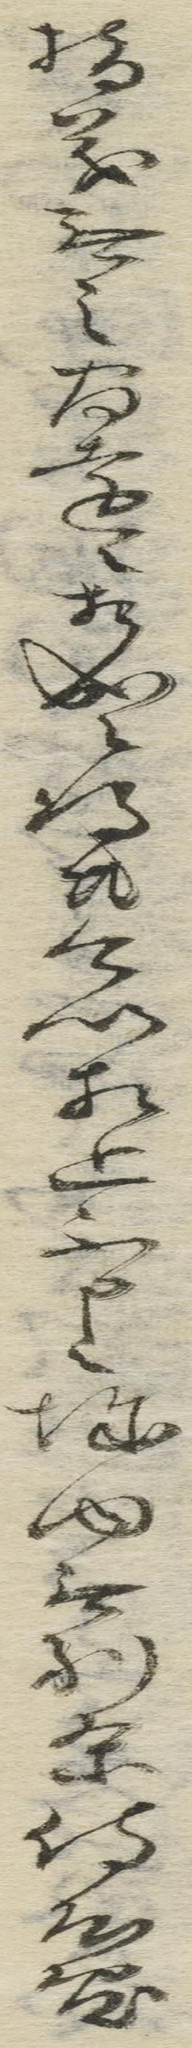指義無之間遠二相成候得共今以相止不申候城内無別状侍屋敷
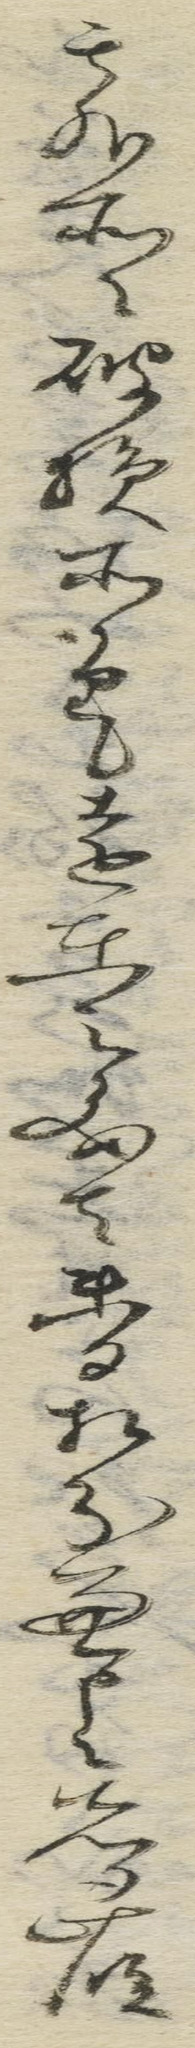其外所々破損所御座候遠在之処は未タ相分兼申候先ッ此段
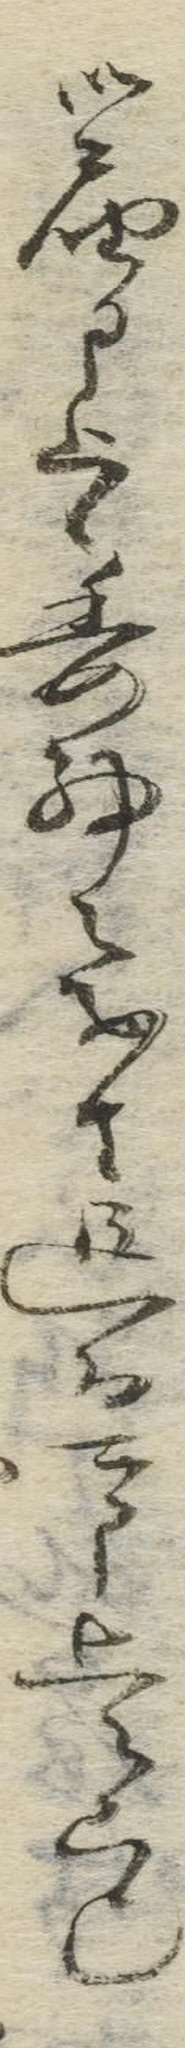御届申上候委細之義は追而可申候以上
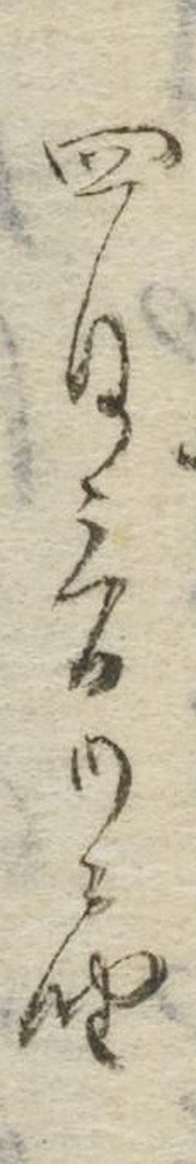四月三日御届
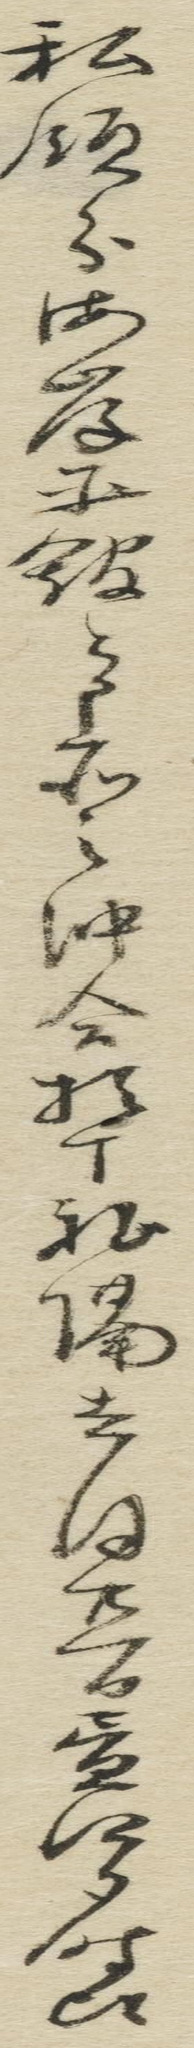私領分海岸平舘と申所之沖合拾丁船場去月廿一日昼四ッ時比
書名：弘化丁未天變日記
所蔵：東京大学地震研究所図書室 Earthquake Research Institute Library, The University of Tokyo, JAPAN
